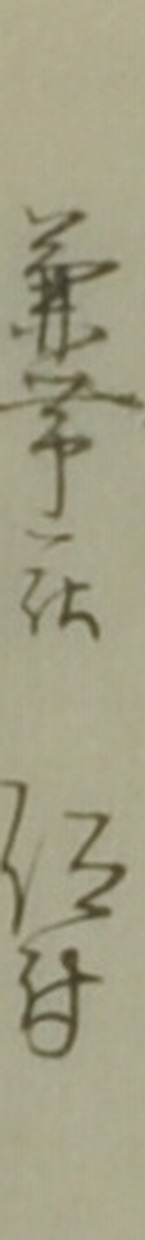兼帯被仰付
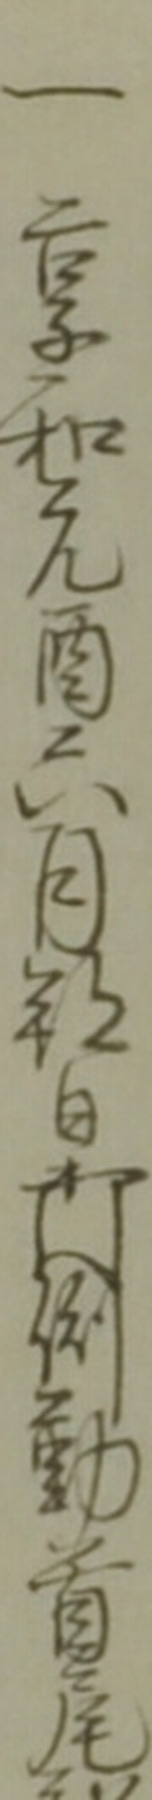一享和元酉六月朔日御側勤首尾能
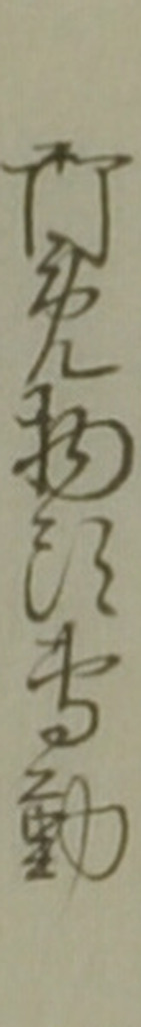御免物頭専勤
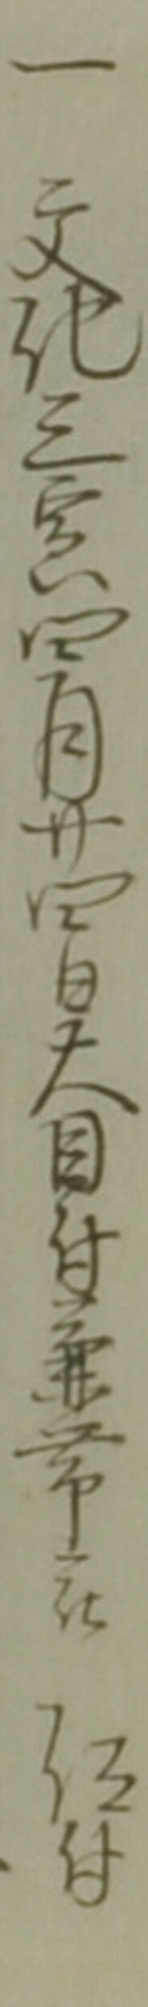一文化三寅四月廿四日大目付兼帯被仰付
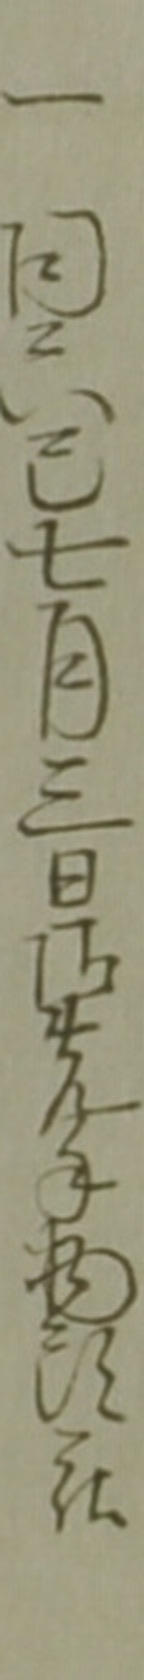一同六巳七月三日御先手物頭被
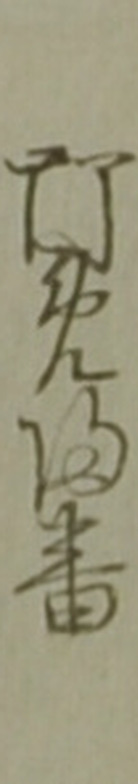御免帰番
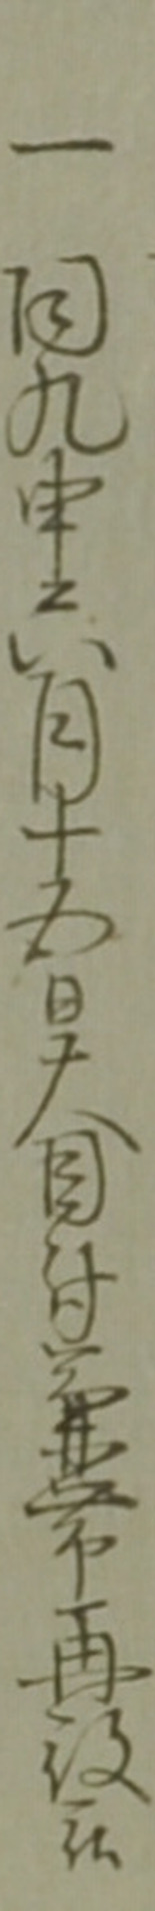一同九申六月十五日大目付兼帯再役被
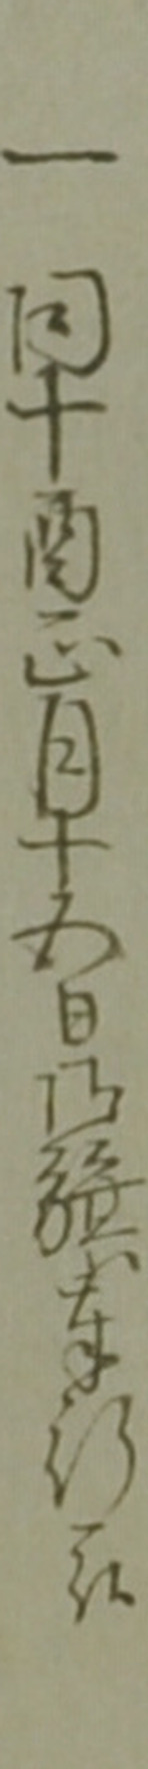一同十酉正月十五日御旗奉行被
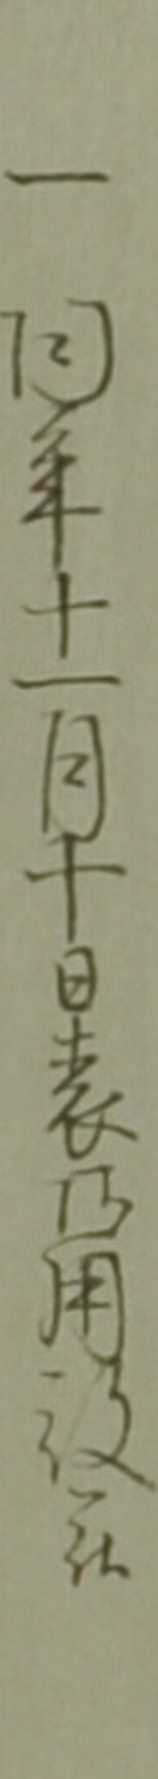一同年十一月十日表御用役被
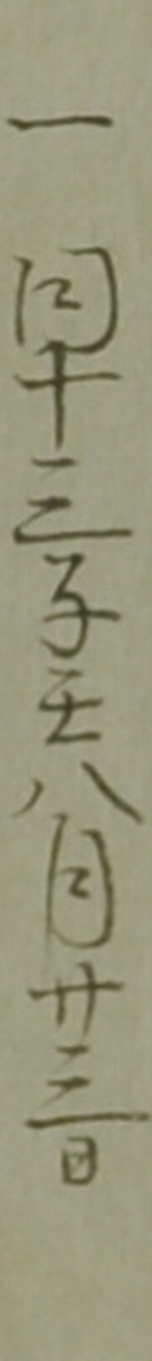一同十三子閏八月廿三日
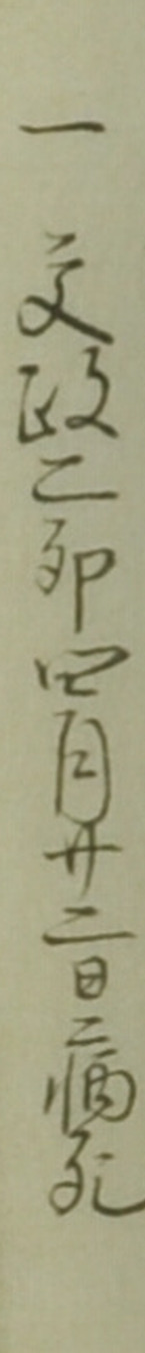一文政二卯四月廿二日病死

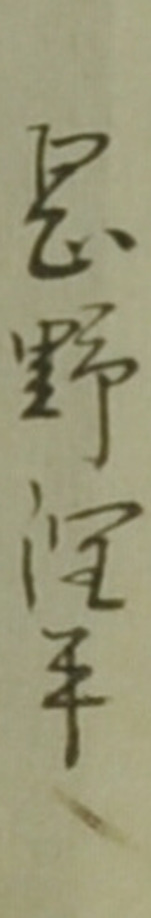岡野潤平
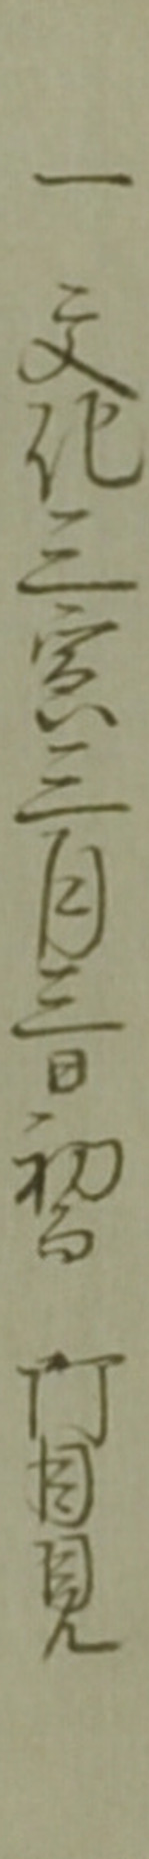一文化三寅三月三日初而御目見
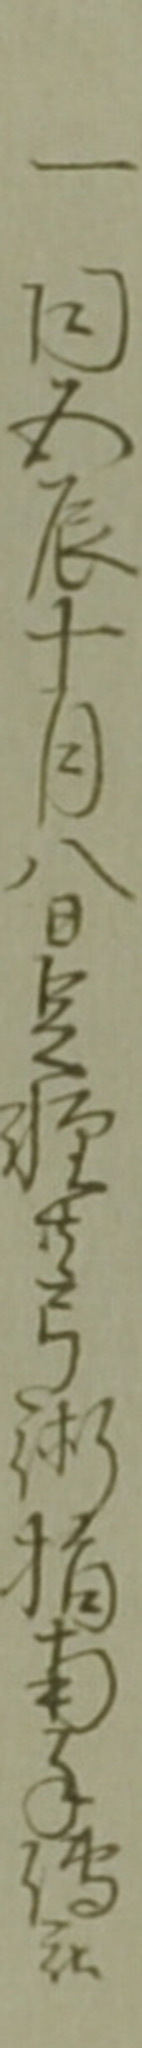一同五辰十月八日足軽共弓術指南手伝被
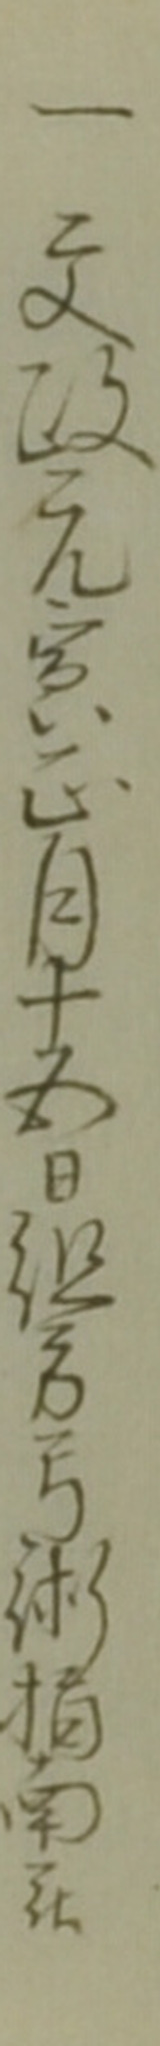一文政元寅正月十五日組方弓術指南被
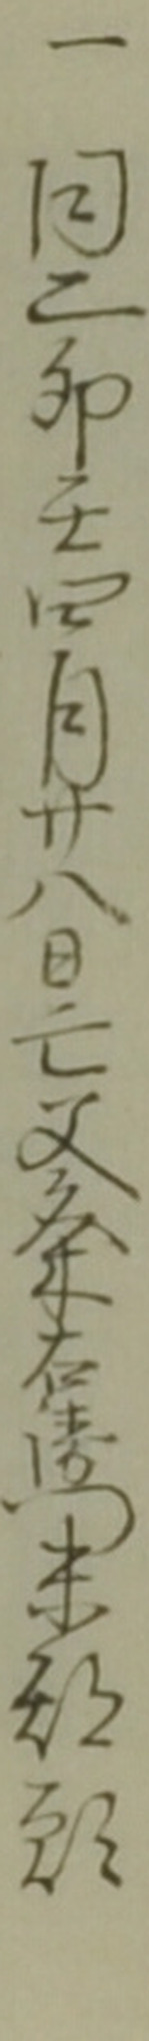一同二卯閏四月廿八日亡父粂右衛門末期願
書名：給人諸士勤仕録（三）
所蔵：伊那市立高遠町図書館・合同会社AMANE
